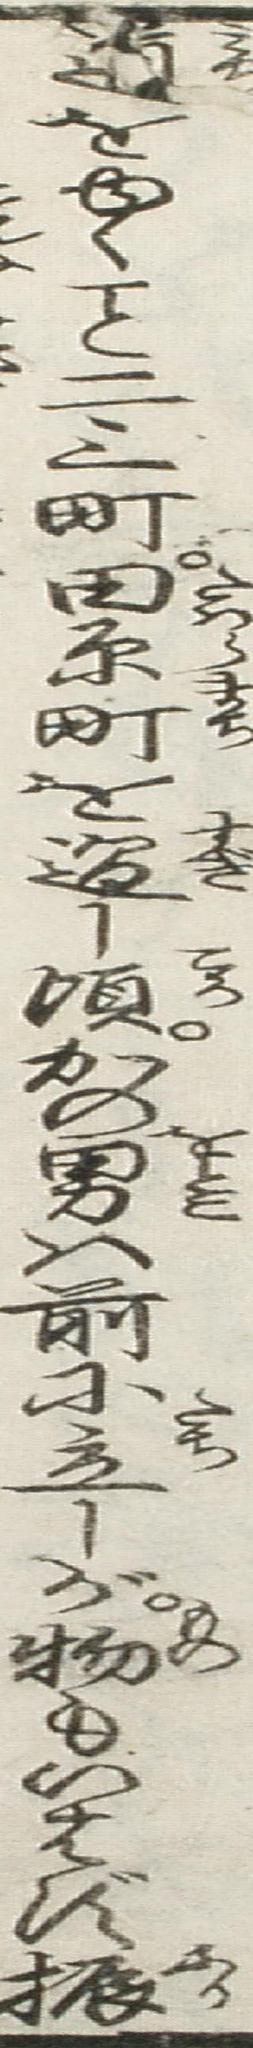道をゆくこと二三町。田原町を過し頃。かの男は前に立しが。物もいはず振
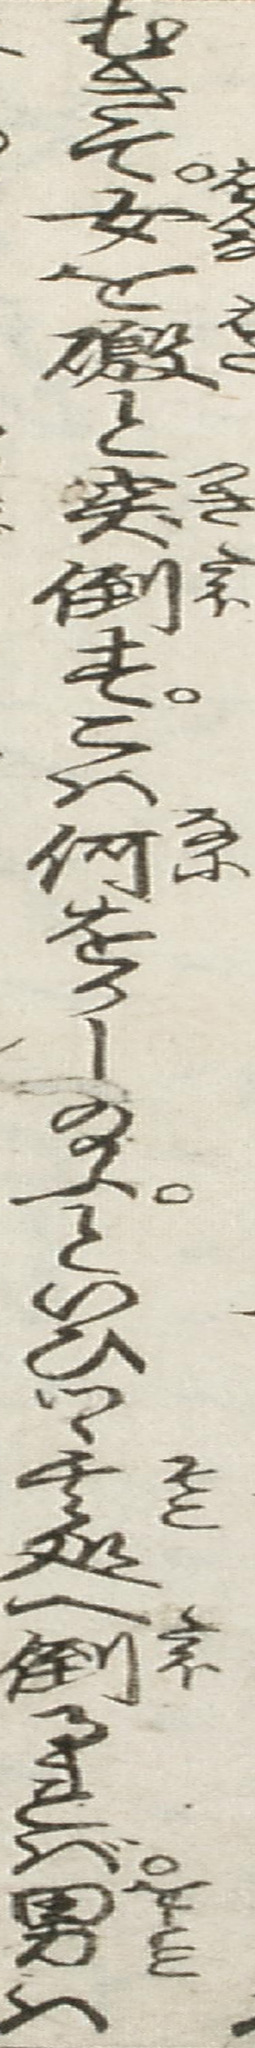むきて。女を磤と突倒す。こは何をかし給ふといひつゝ其処へ倒るれば。男は
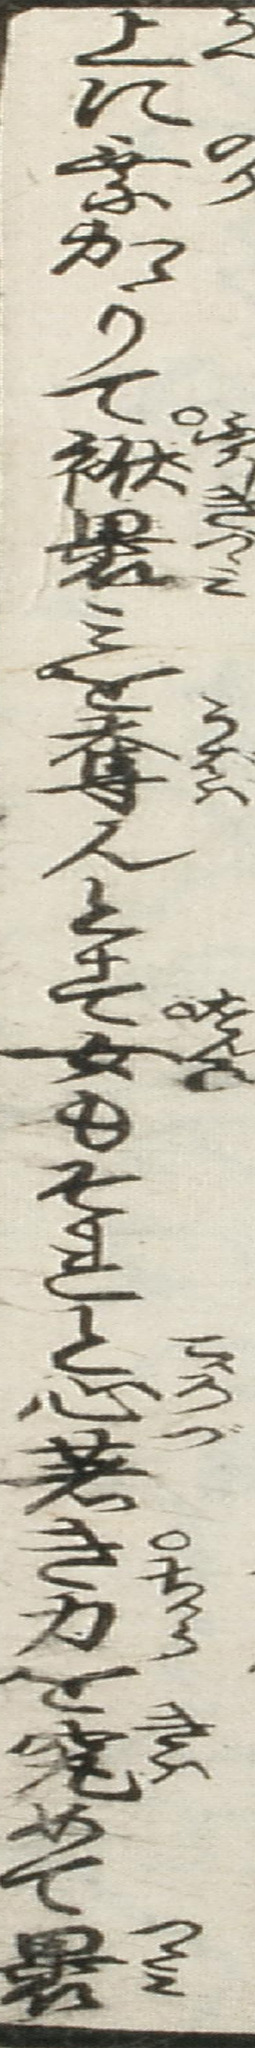上に乗かゝりて袱裹みを奪んとす。女もそれと心著き。力を極めて裹
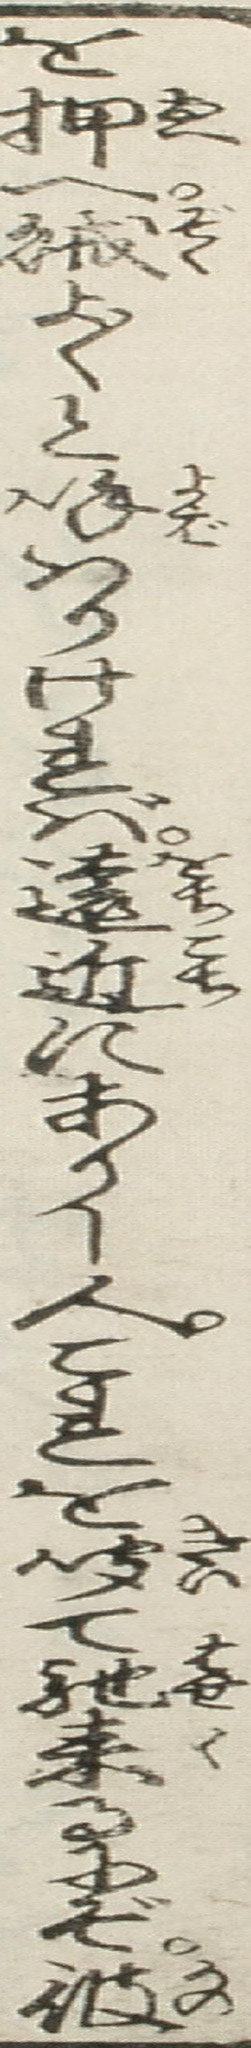を押へ賊よ〳〵と呼はりければ。遠近にありし人。これを聞て駈来るにぞ。彼
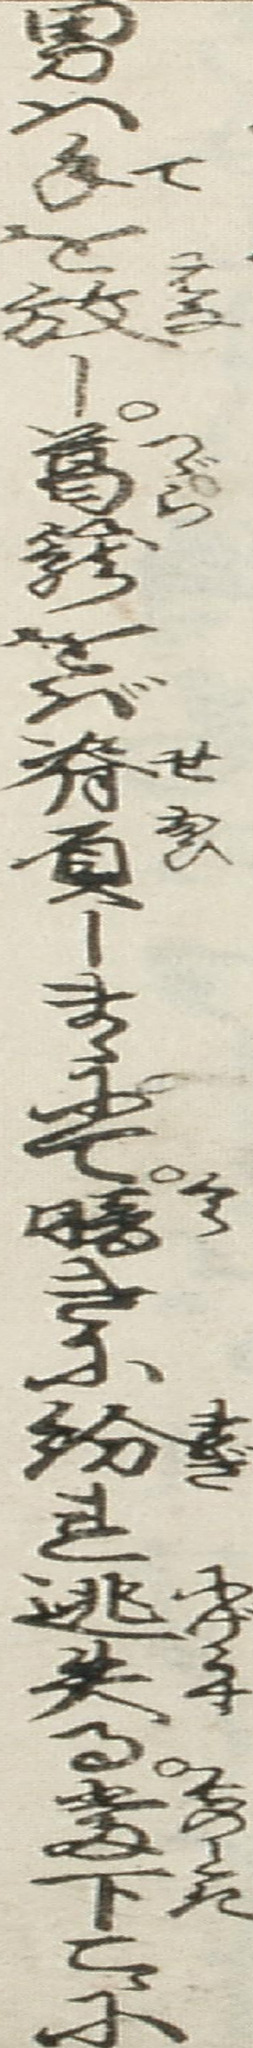男は手を放し。葛籠をば背負しまゝにて。暗きに紛れ逃失る。当下こゝに
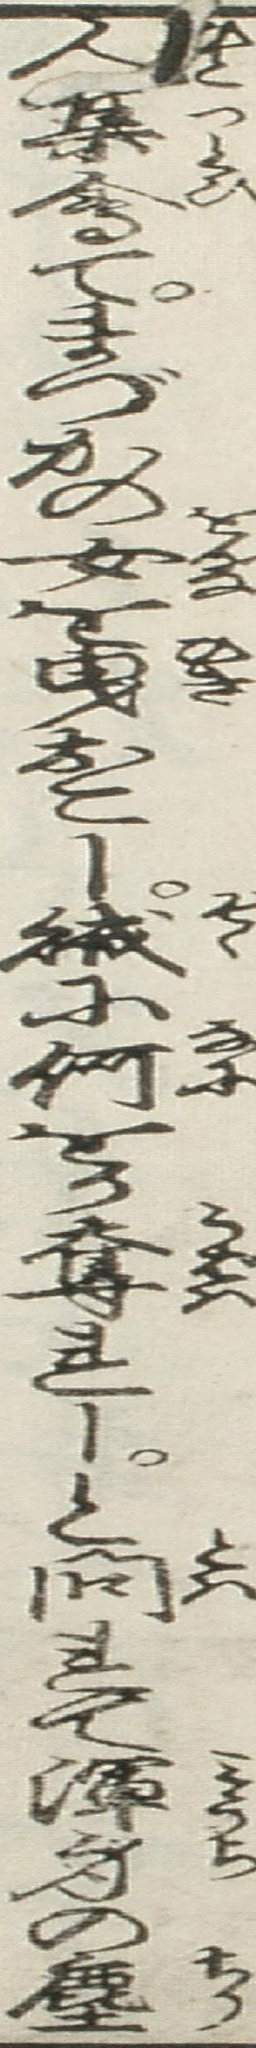人集会て。まづかの女を曳おこし。賊に何をか奪れし。と問れて渾身の塵
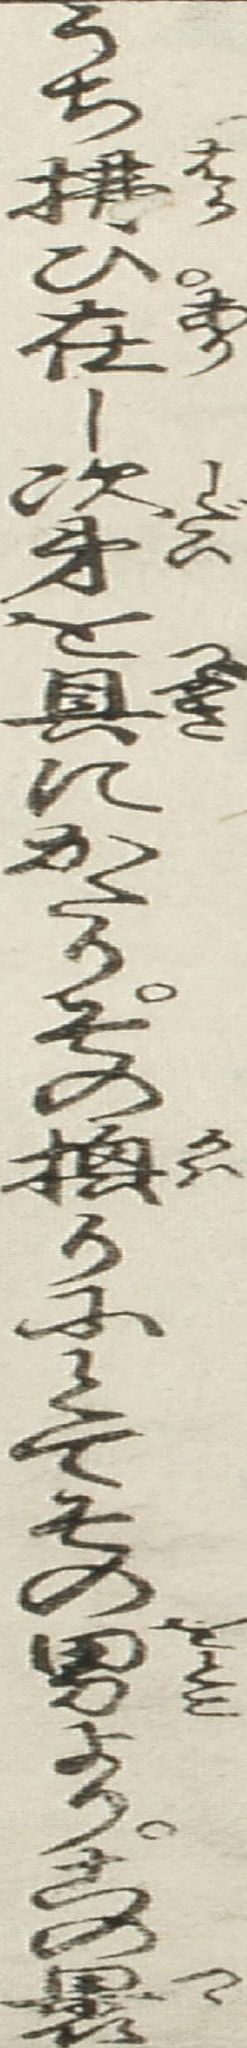うち払ひ。在し次第を具にかたり。その換りにとてその男より。この裹
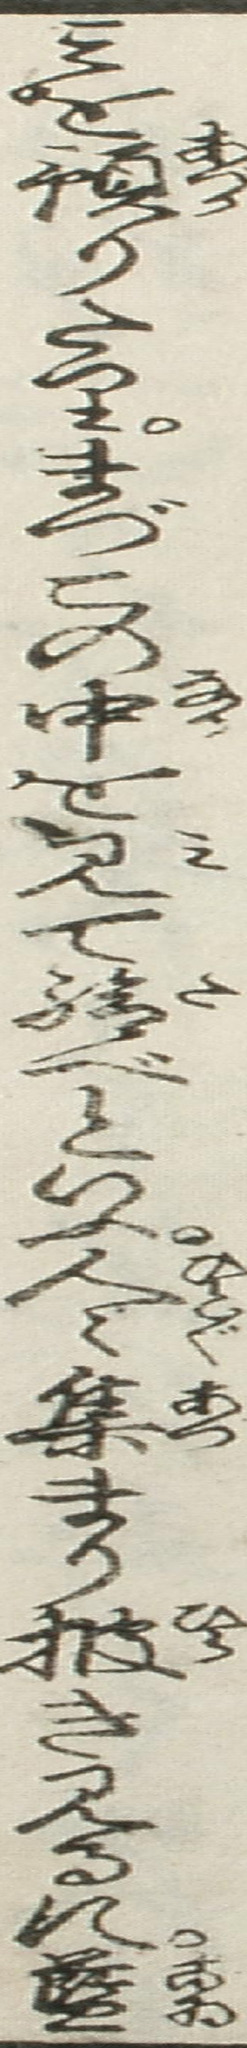みを預りたり。まづこの中を見て給べといふ。人々集まり披き見るに。藍
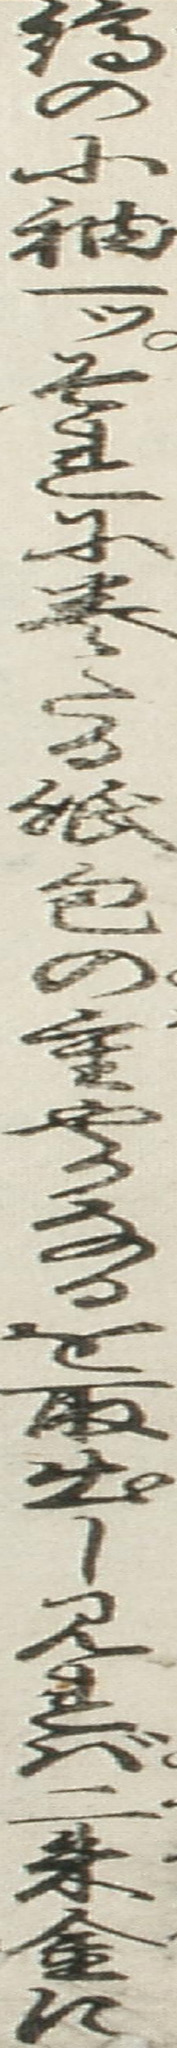縞の小袖一ッ。それに巻たる紙包の。重やかなるを取出し見れば。二朱金に
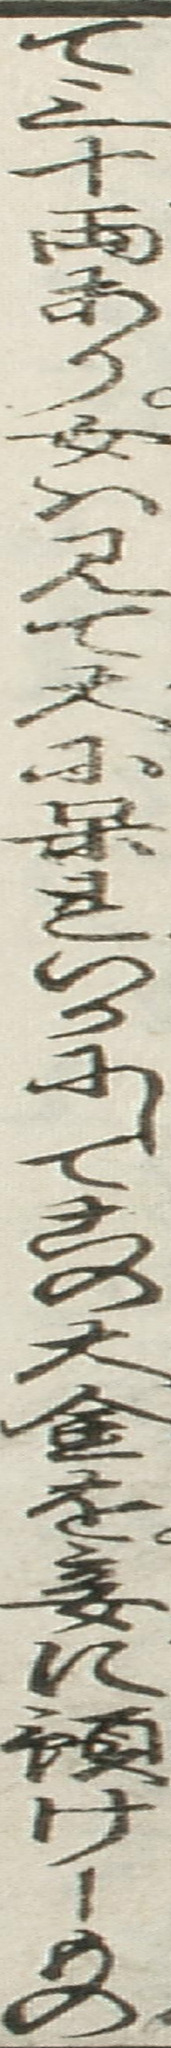て三十両あり。女は見て大に呆れ。いかにしてこの大金を妾に預けしもの
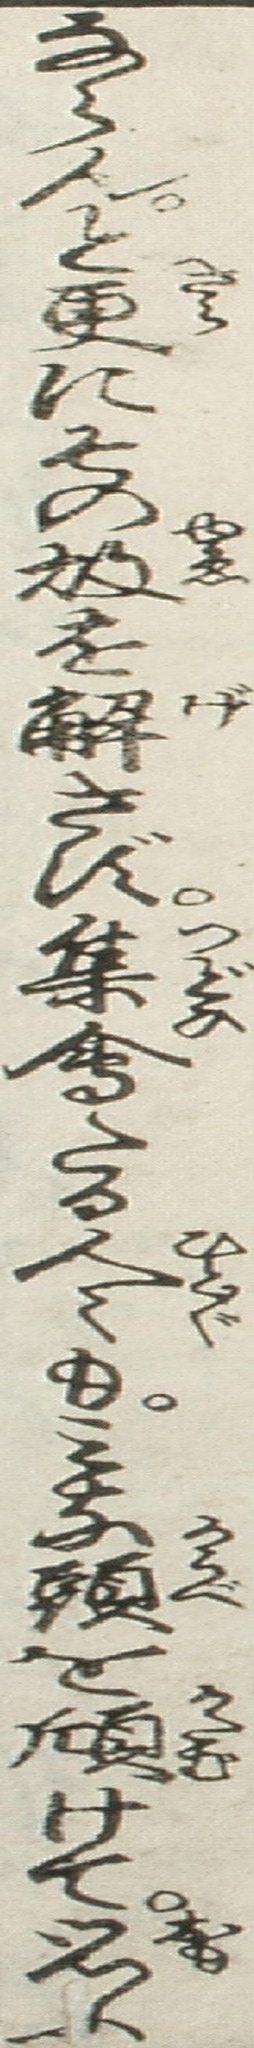ならん。と更にその故を解さず。集会たる人々も。みな頭を傾けて思ふ
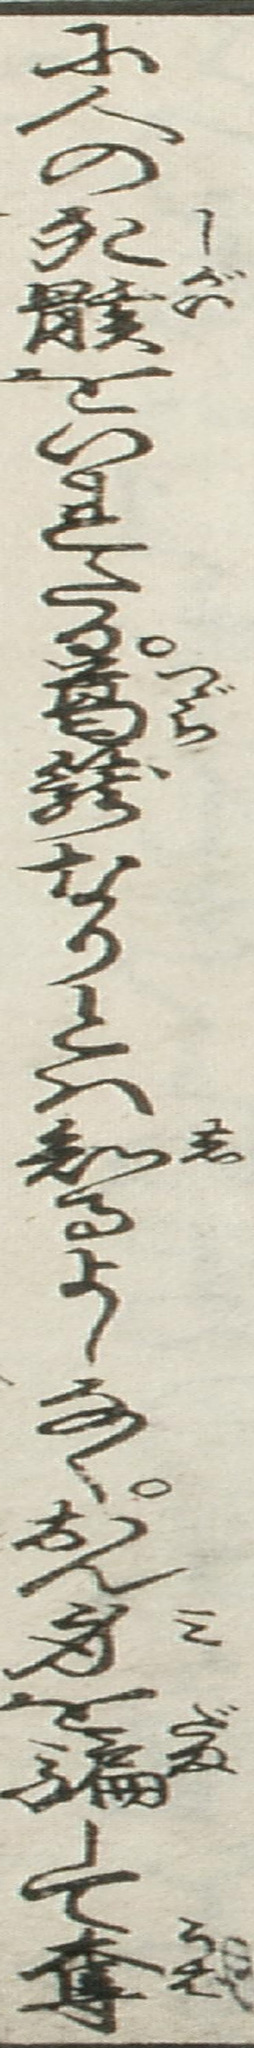に人の死骸をいれたる。葛籠なりとは知るよしなく。おん身を騙して奪
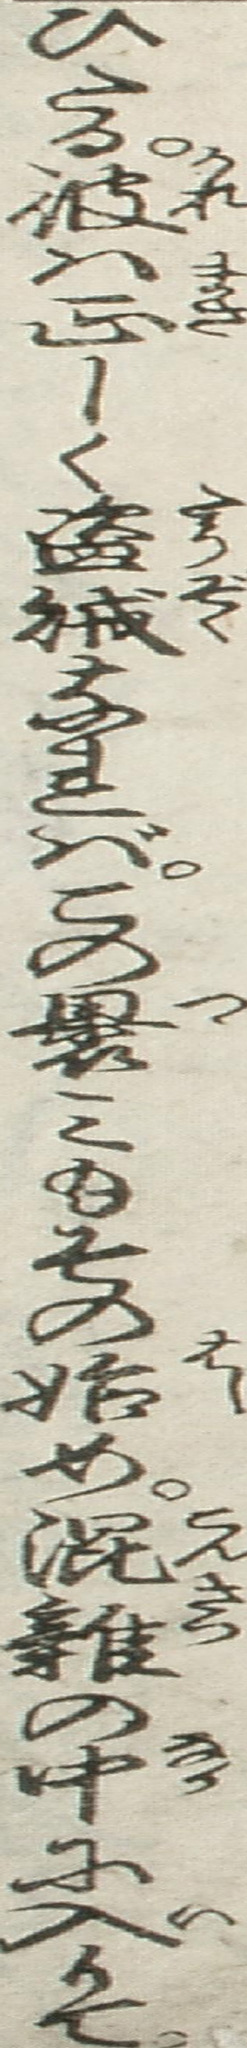ひたる。彼は正しく盗賊なれば。この裹みもその始め。混雑の中に入りて。
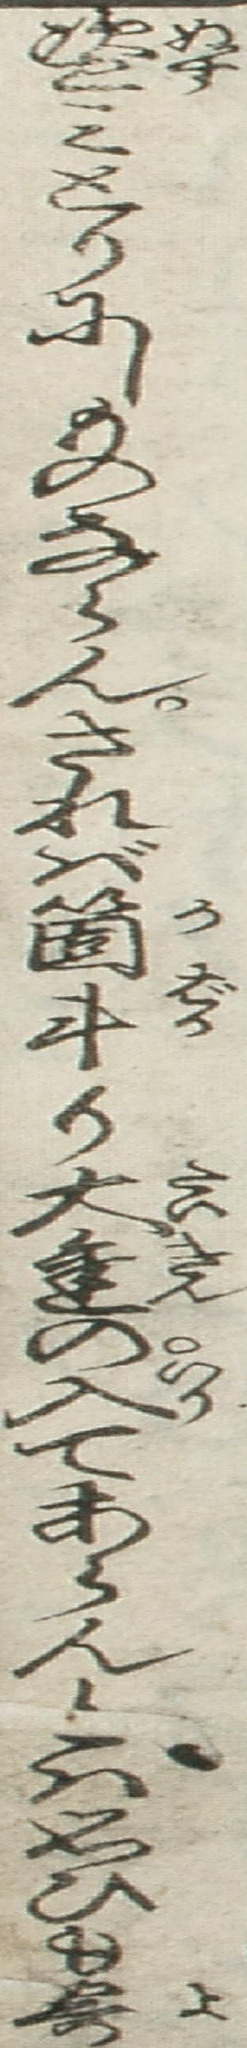盗みとりにしものならん。されば箇計り大金の。入てあらんとは思ひも寄

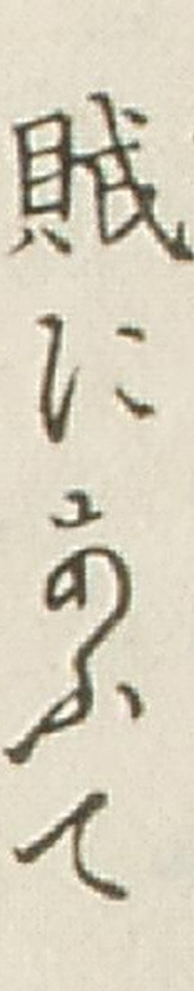賊にあふて
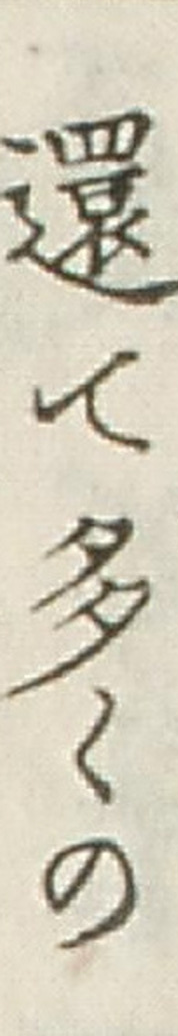還て多くの
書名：安政見聞録　下
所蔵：東京大学地震研究所図書室 Earthquake Research Institute Library, The University of Tokyo, JAPAN
